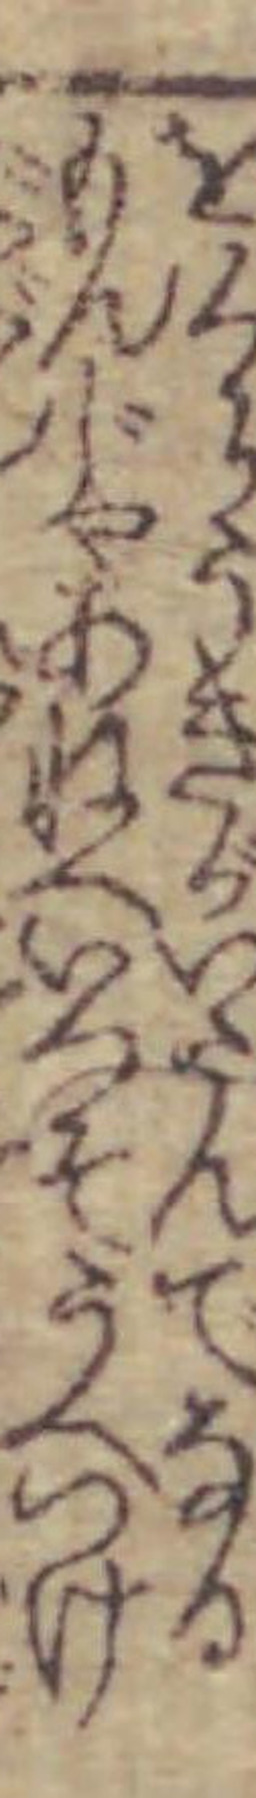もんじやあねへいつそうへつけ
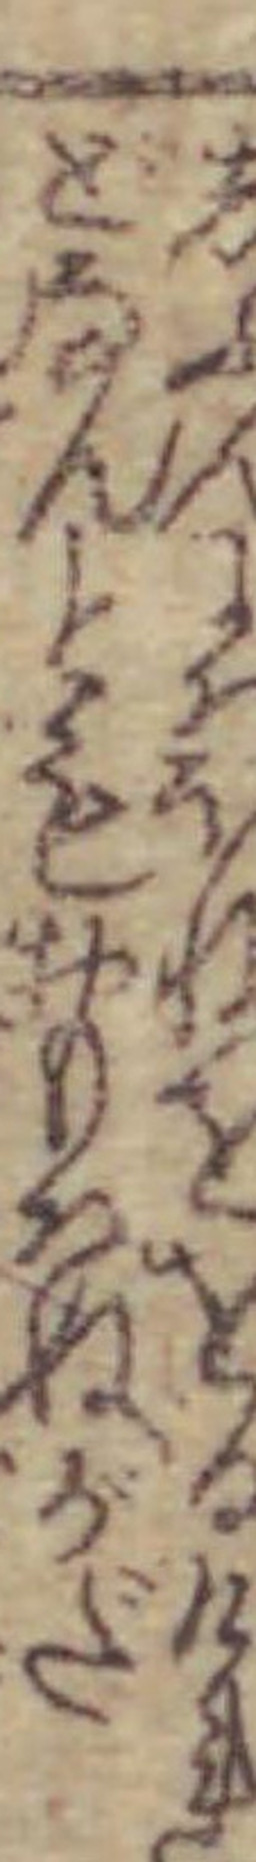どなんともおもはぬがだ
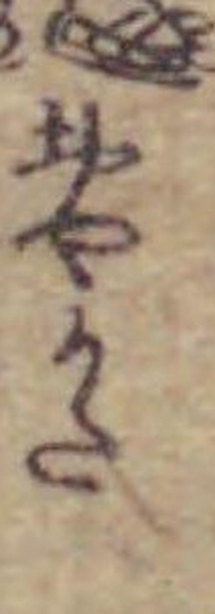おやかた
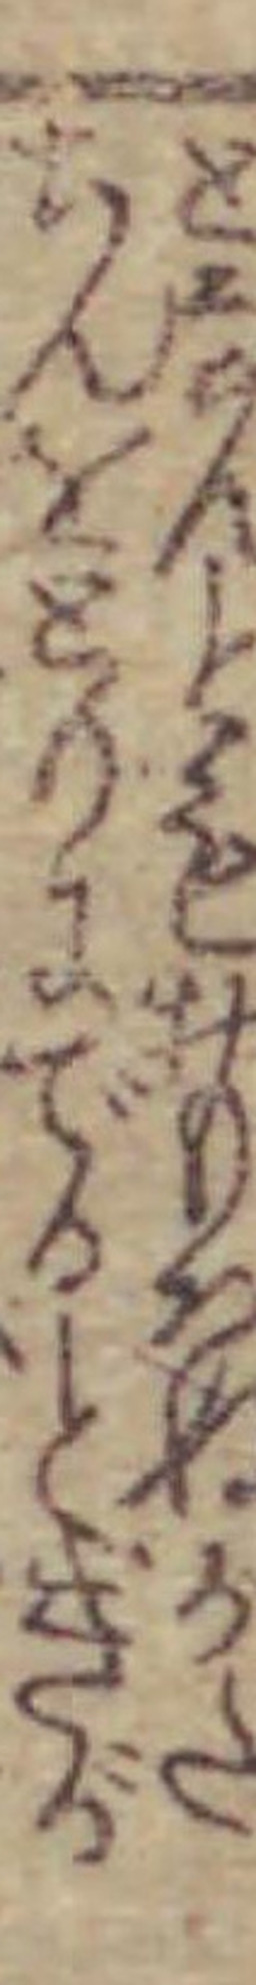ちんをとりにでるときが
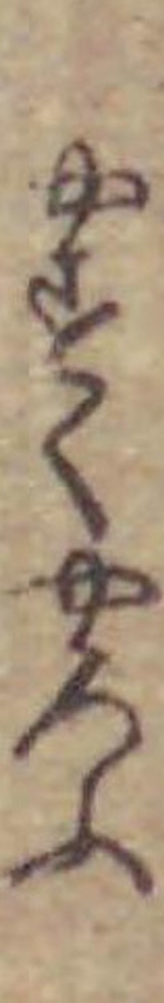やすくやろふ
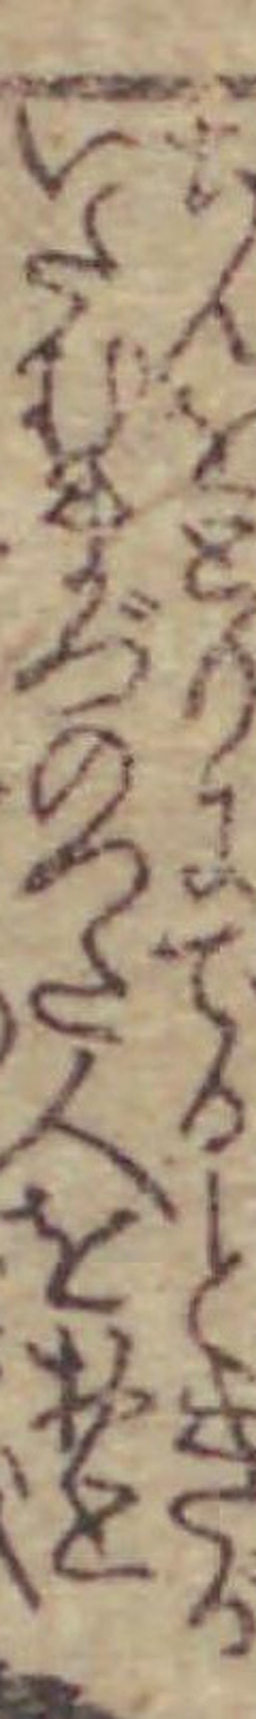いたむまづのつた人をおと
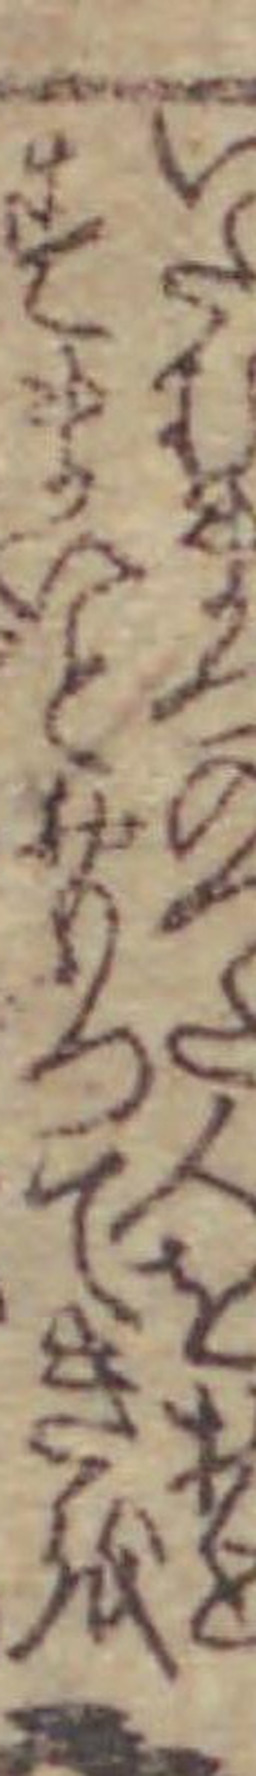すまいとおもつてきを
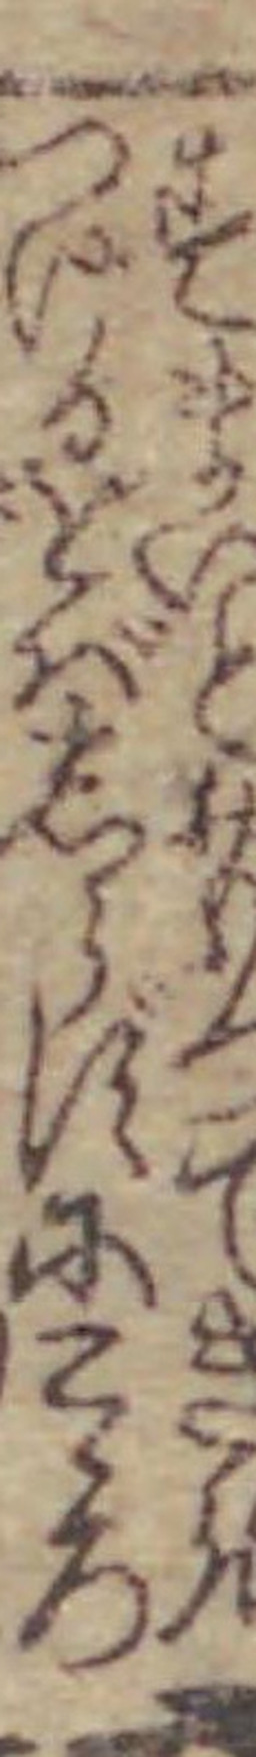つけるをばしらずにこゝろ
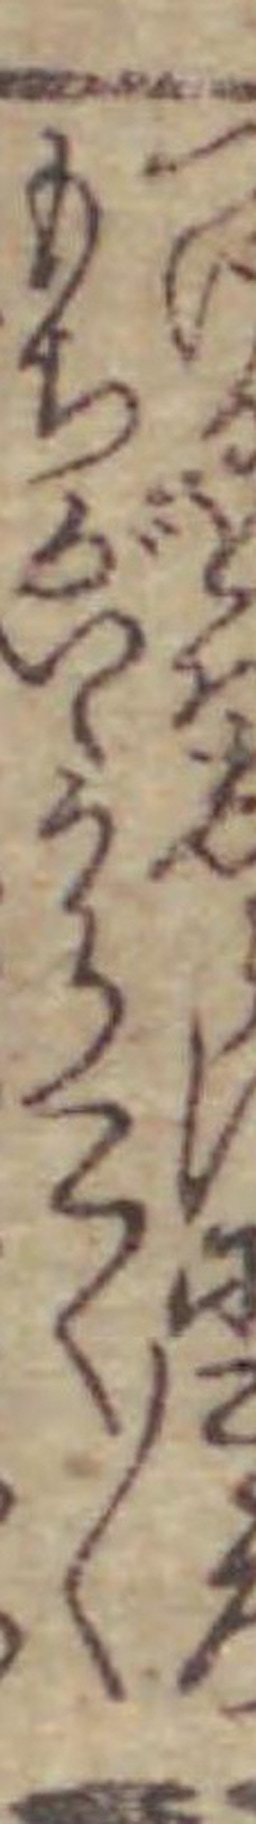もちがいゝからこく〳〵
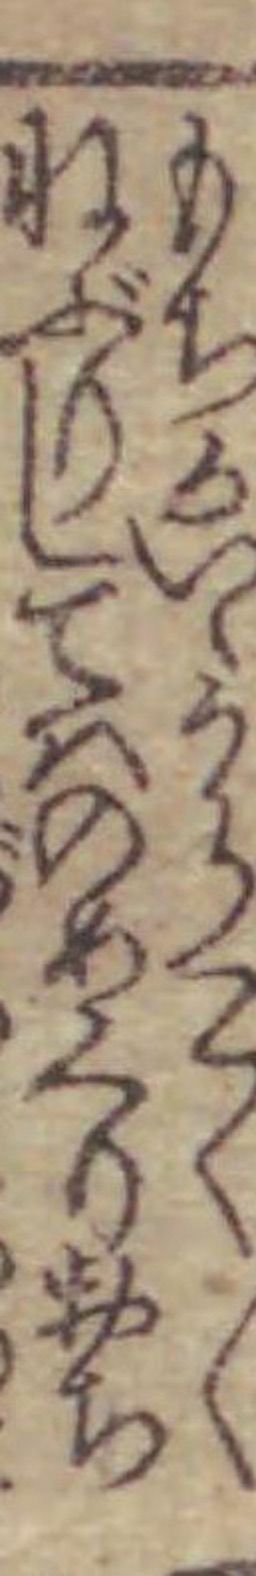ねぶりしてはのめくりおち
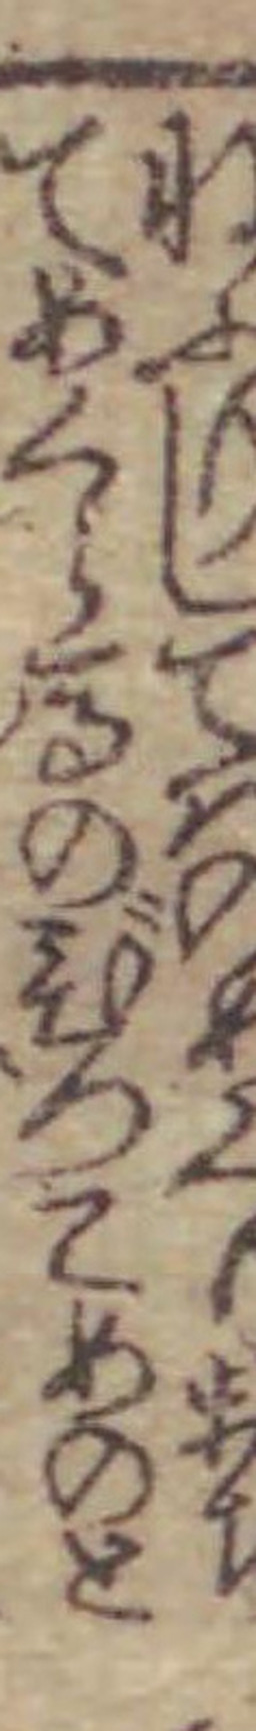てめくら馬のびつこめのと
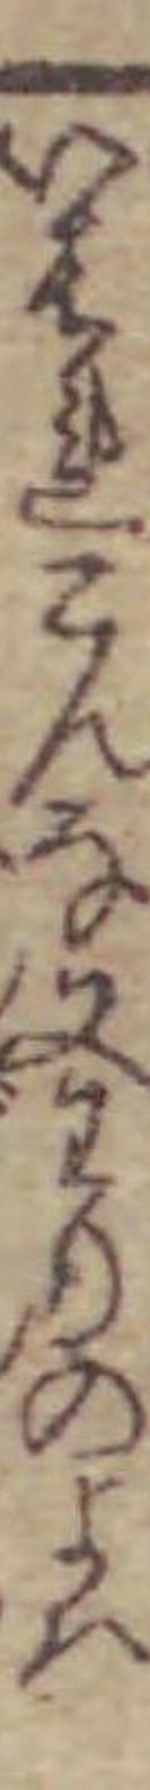いはれこんな又わりのよは
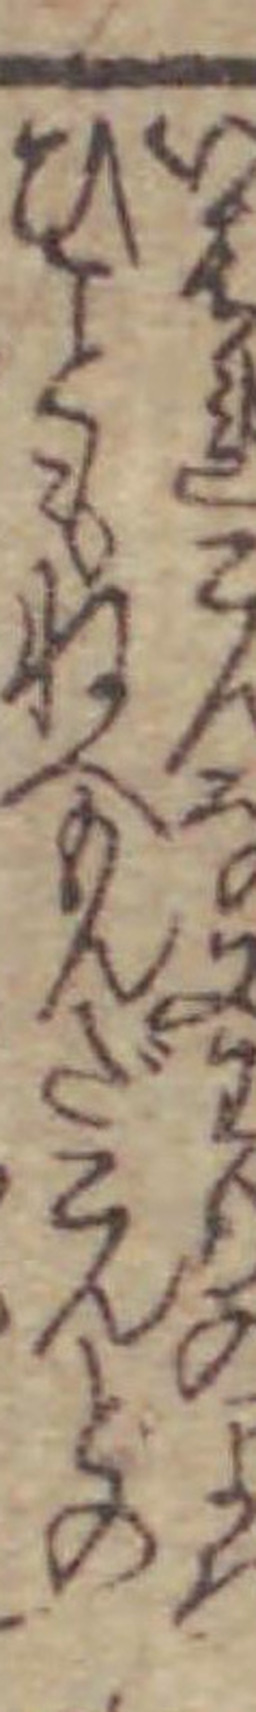ひこともねへもんだこんどの
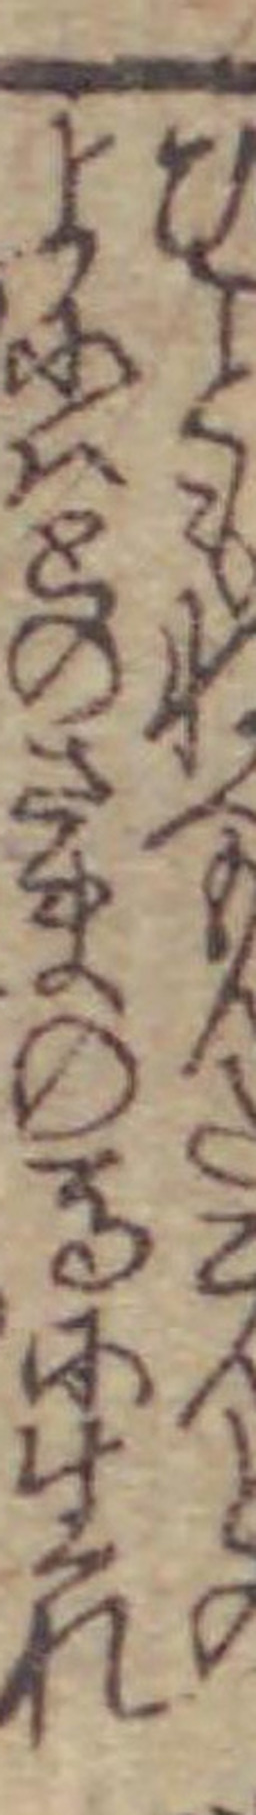よにはとのさまの馬に生れ
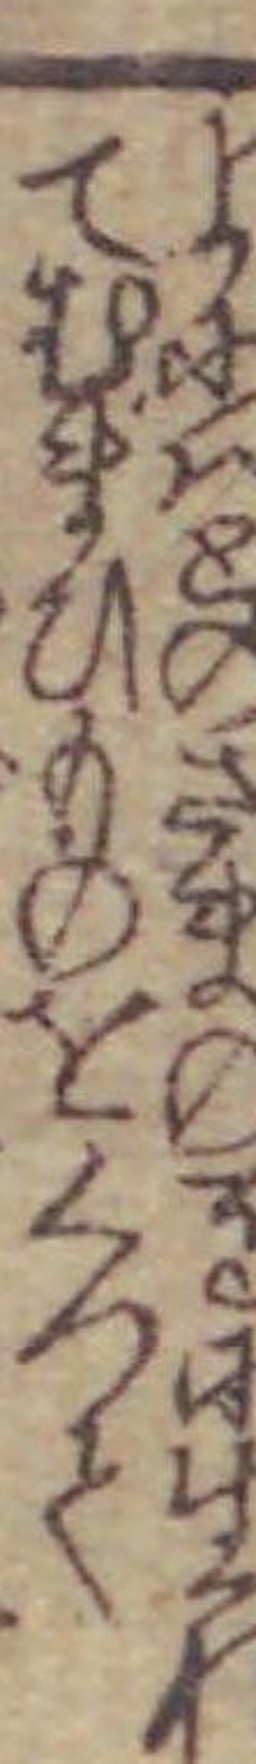てむまひものをくつて
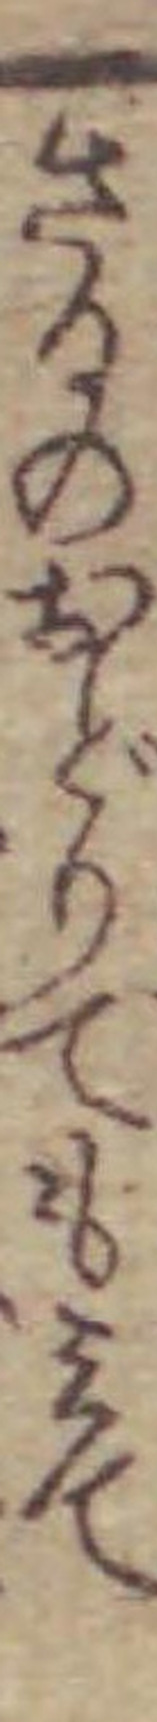さるのおどりてもみて
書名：即席耳学問 : 3巻
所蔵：国立国会図書館 National Diet Library, JAPAN
